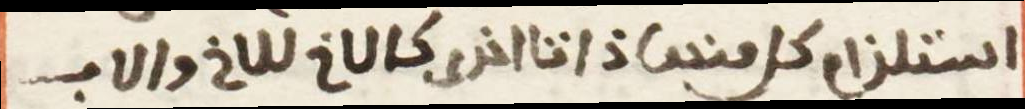استلزام كل منها ذاتا اخرى كالاخ للاخ والأب
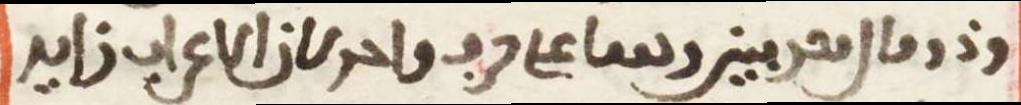وذو مال معربين وهما على حرف واحد كان الاعراب زايد
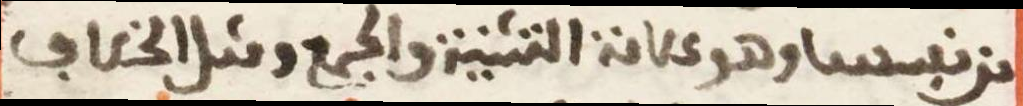من نفسها وهو علامة التثنية والجمع ومثل الخلاف
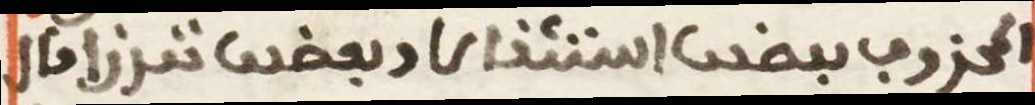المحذوف بعضها اشتغالا وبعضها تعذرا قال
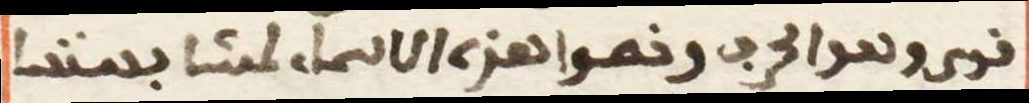قوى وهو الحرف وخصوا هذه الاسماء لمشابهتها
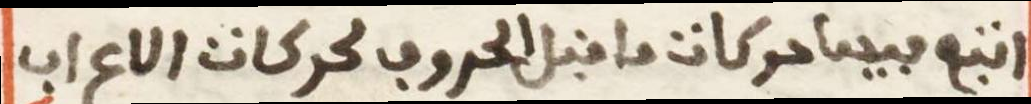اتبع فيها حركات ما قبل الحروف لحركات الاعراب
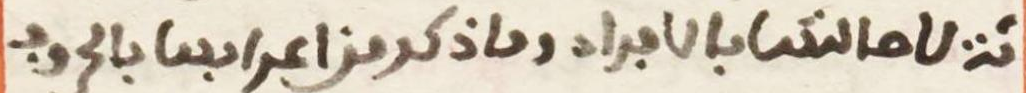ثة لاصالتها بالافراد وما ذكر من اعرابها بالحروف
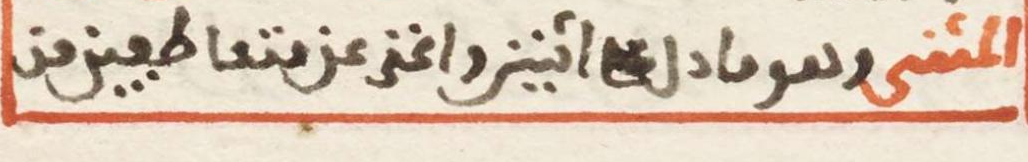المثنى هو مادل على لاثنين واغني عن متعاطفين من
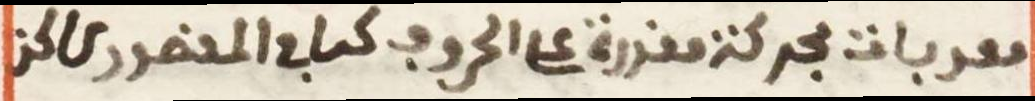معربات بحركة مقدرة على الحروف كالمقصورلالحن
